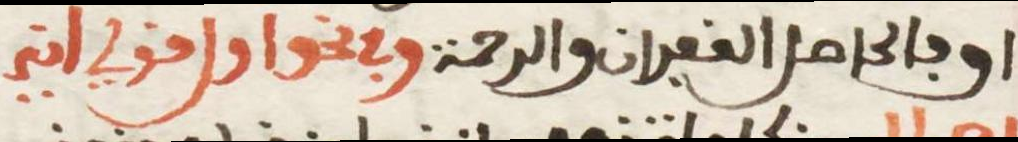او فالحاصل الغفران والرحمة وفي نحو اول قولي اني
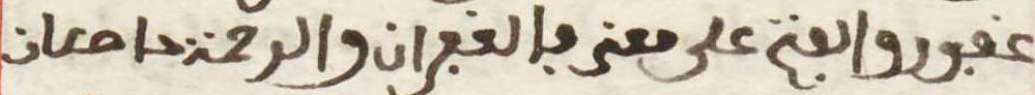غفور والفتح على معنى فالغفران والرحمة حاصلان
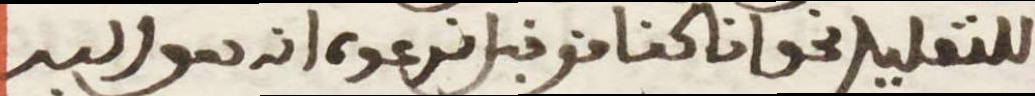للتعليل نحو انا كنا من قبل ندعوه انه هو البر
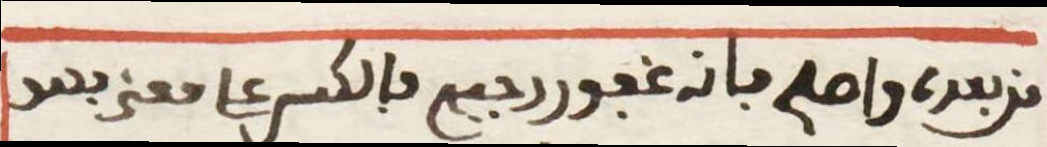من بعده واصلح فانه غفور رحيم فالكسر على معنى فهو
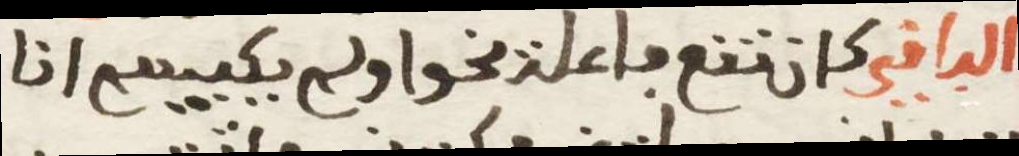الباقي كان تقع فاعلة نحو اولم يكفكم انا
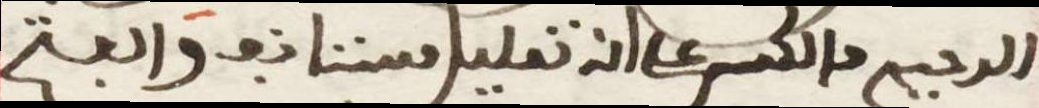الرحيم فالكسر على انه تعليل مستانف والفتح
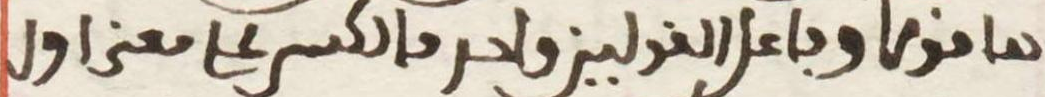ها قولا وفاعل القولين واحد فالكسر على معنى اول
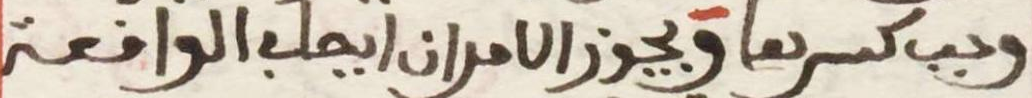من واختلف القايل نحو قولي وجب كسرها ويجوزالامران أيضا في الواقعة
